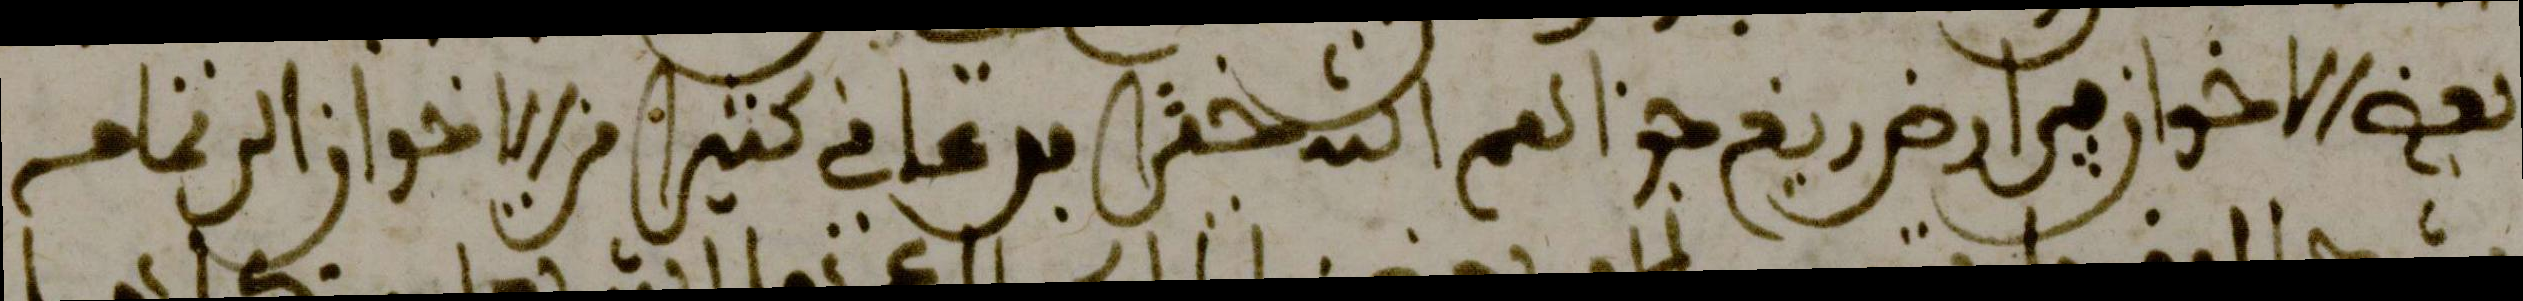بعض الاخوان في ارض ريغ جزاهم الله خيرًا فدعاني كثير من الاخوان الى تمامه
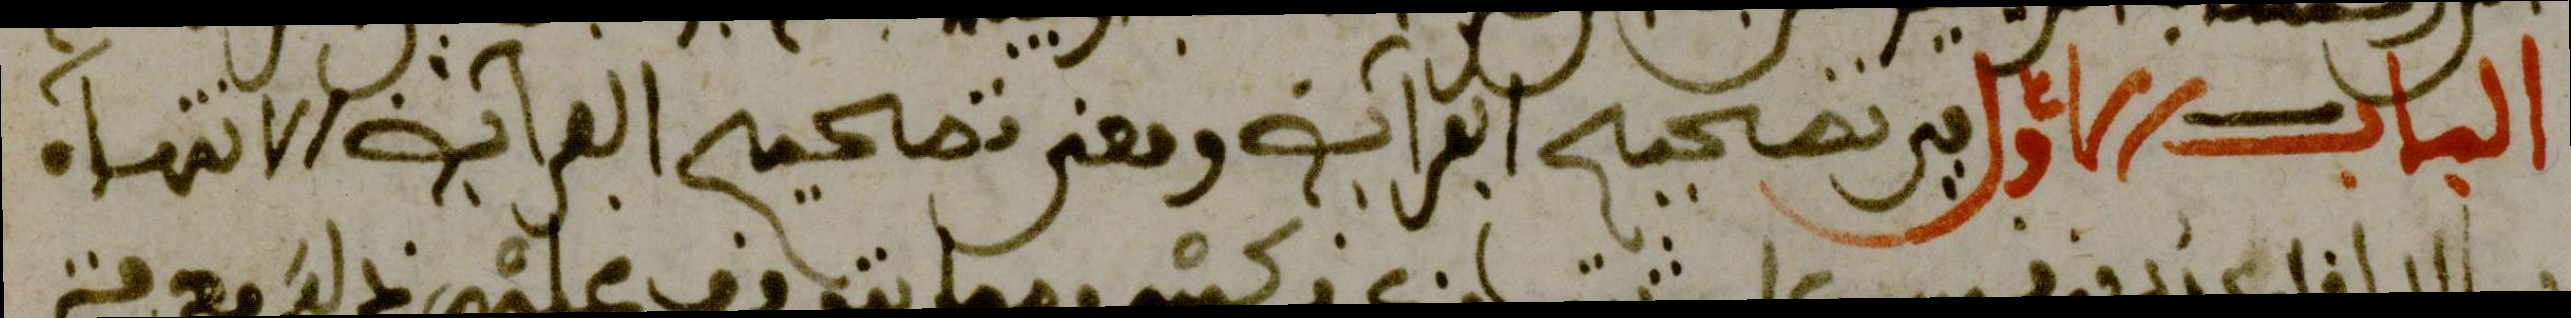الباب الاوَّل في تصحيح الفرائض ومعنى تصحيح الفرائض الانتهاء
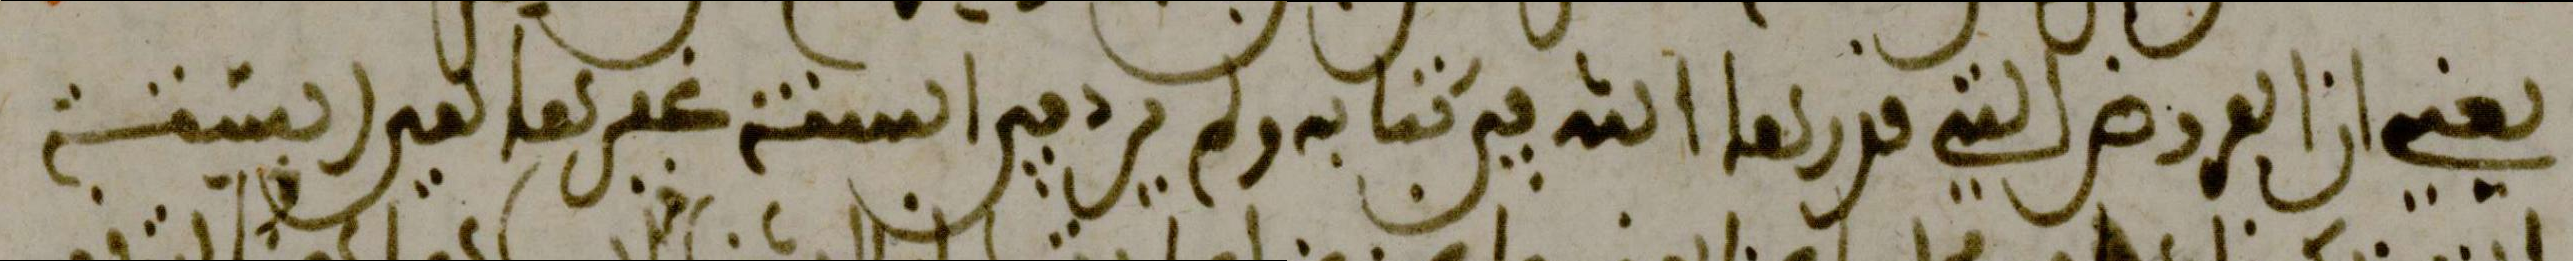يعني ان الفروض التي قدرها الله في كتابه ولم يردد في السنة غيرها هي السِّتة
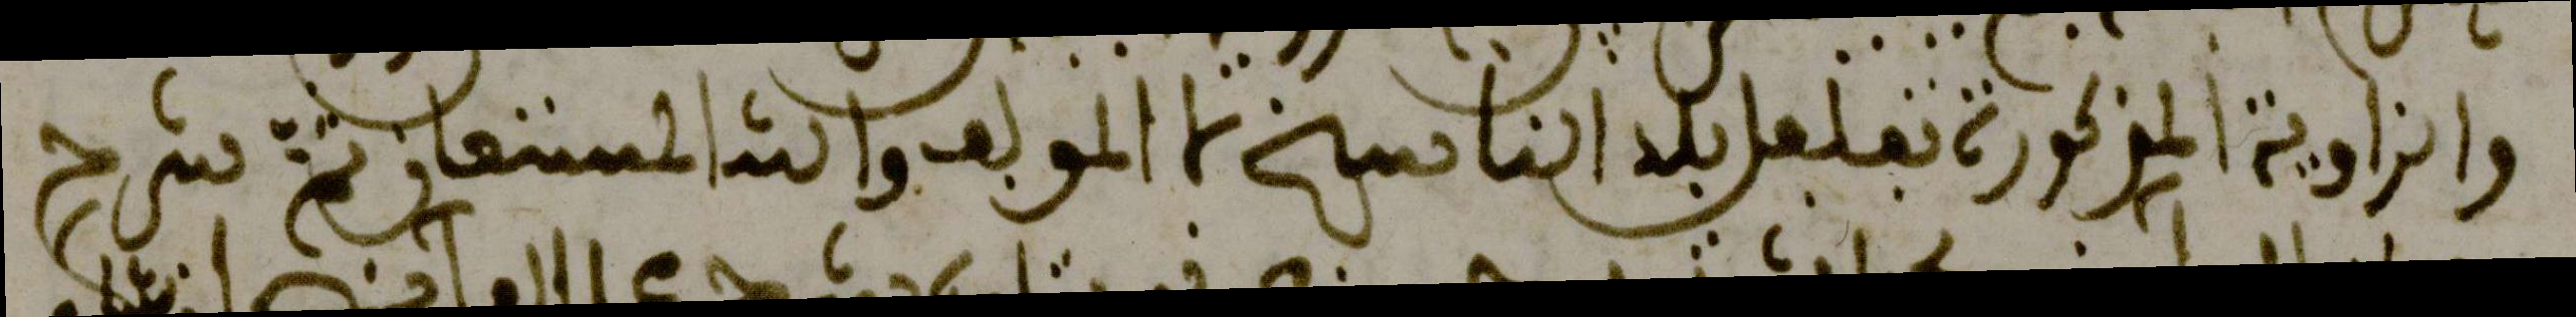والزاوية المذكورة تفلفل بلدد الناسخ لا المولف والله المستعان تمَّ شرح
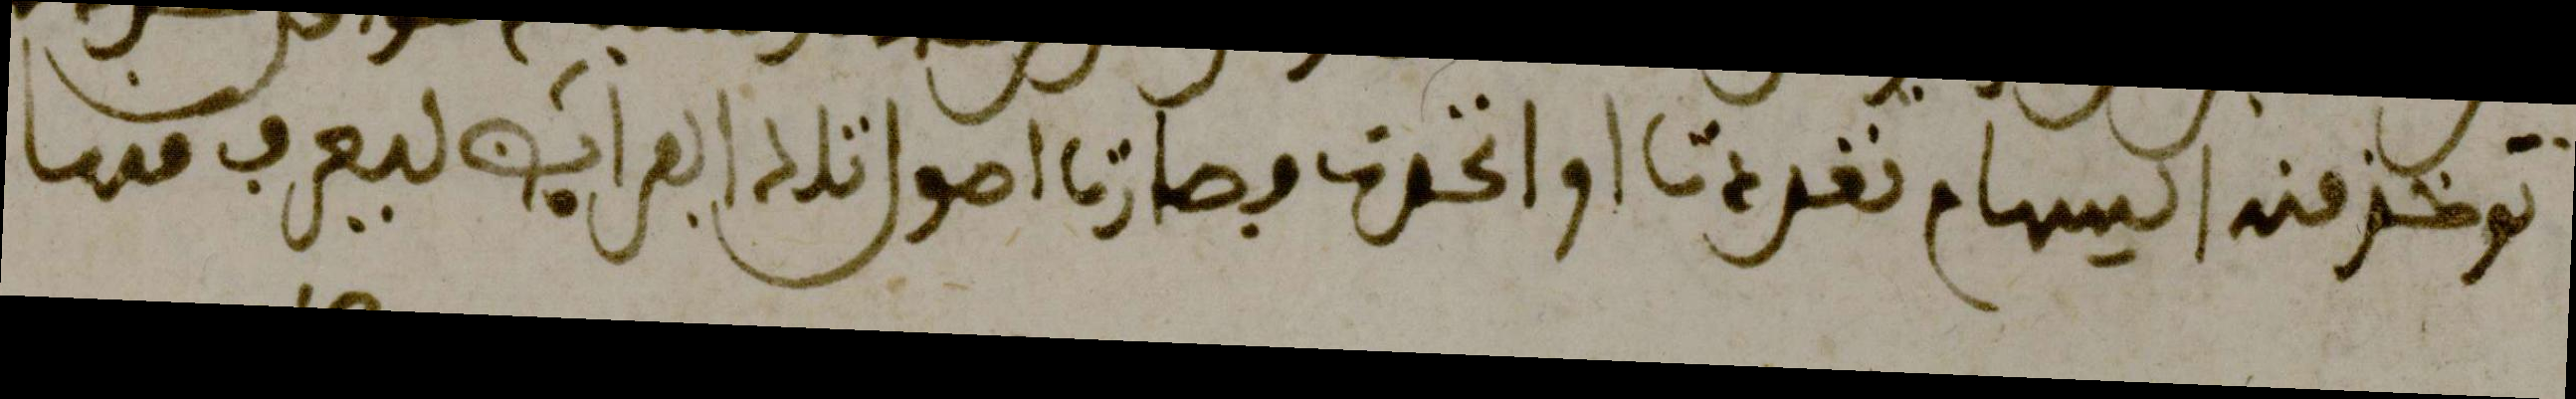توخذ منه السِهام تعددت واتحدت فصارت اصول تلك الفرائض ليعرف منها
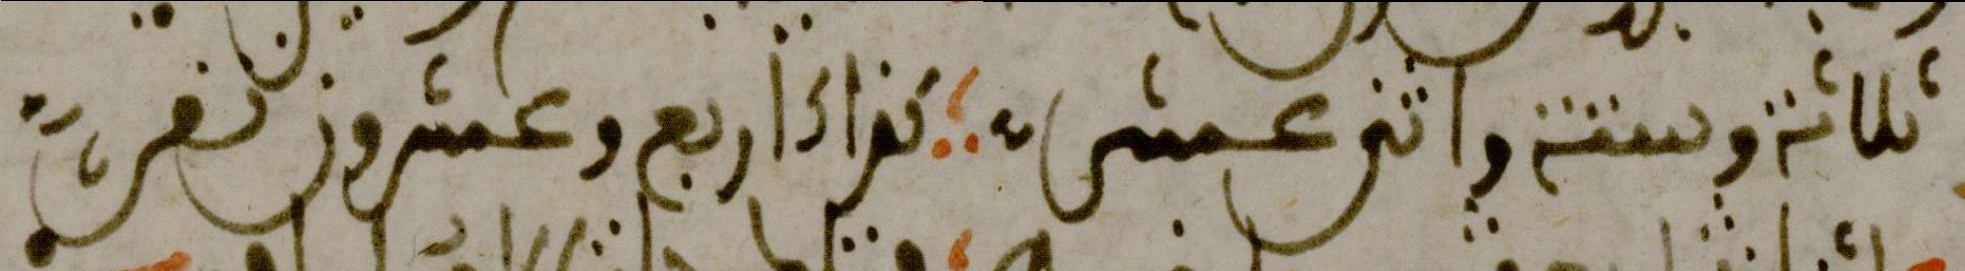ثلاثة وستة واثنى عشر كذاك اربع وعشرون تقر
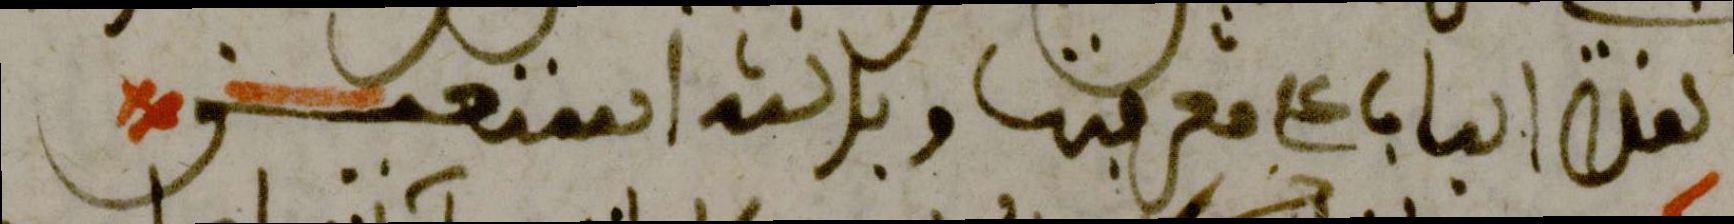هذا الباب على معرفتها وبالله استعين
